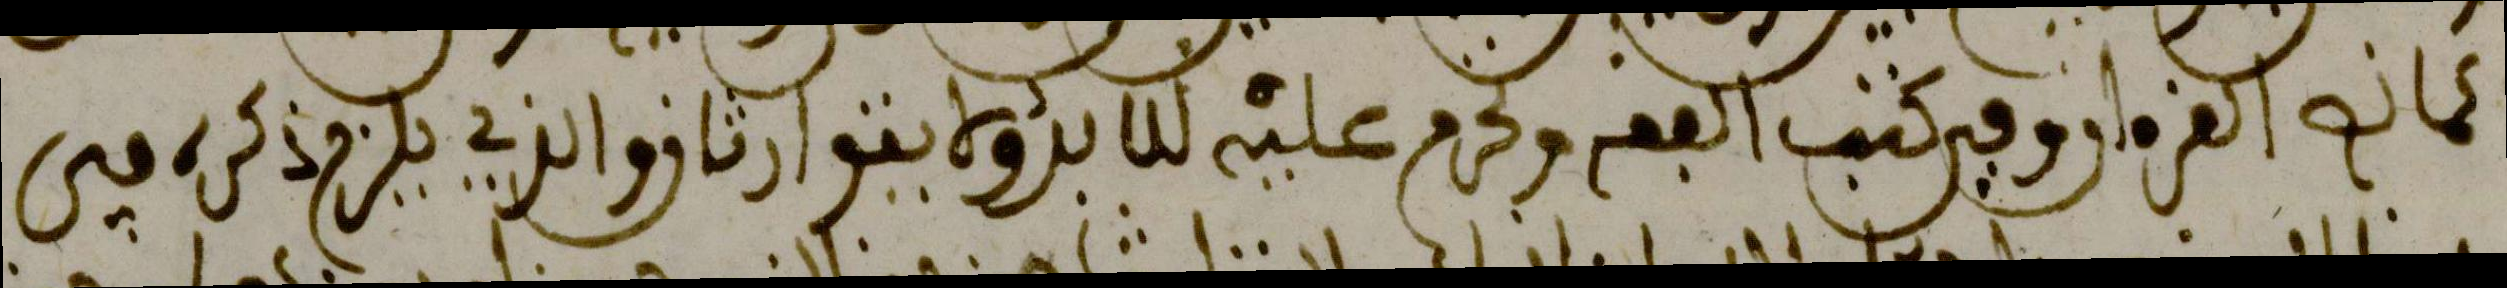كمانع القرءان و في كتب الفقه و تحرم عليه للابد و لا يتوارثان و الذي يلزم ذكره في
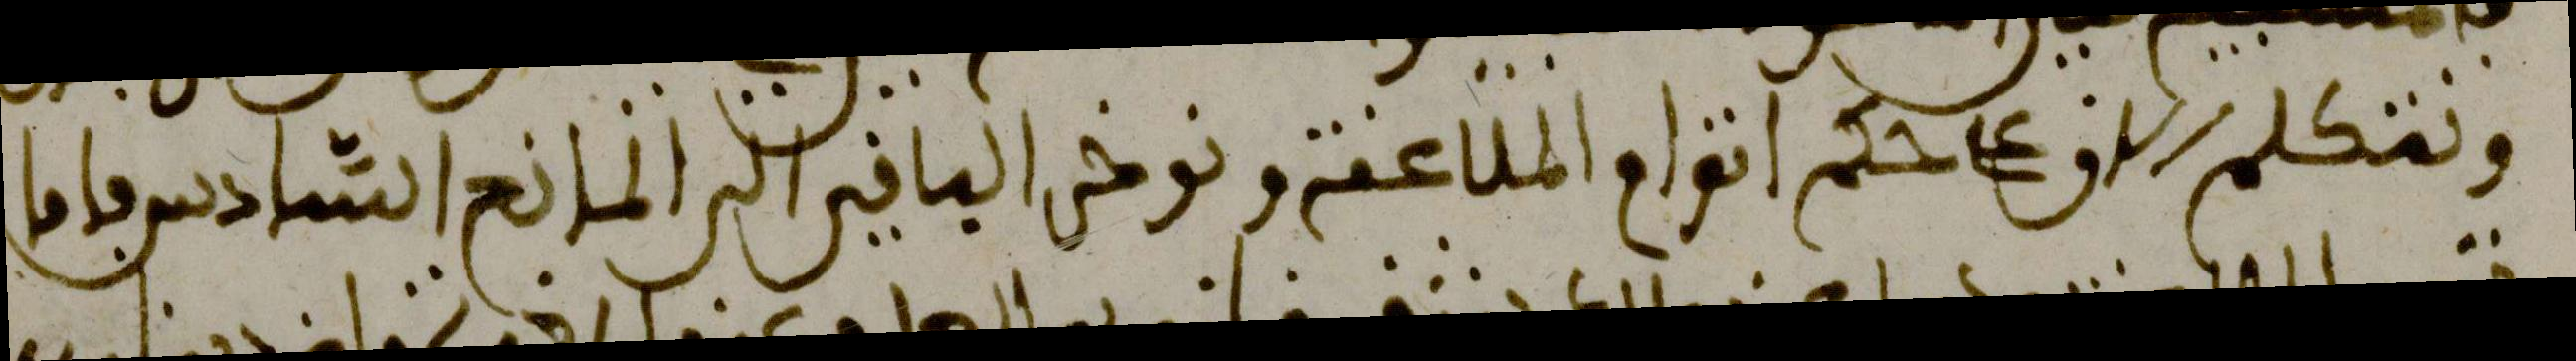و نتكلم الان على حكم اتوام الملاعنة و نوخر الباقي الى المانع السّادس فاما
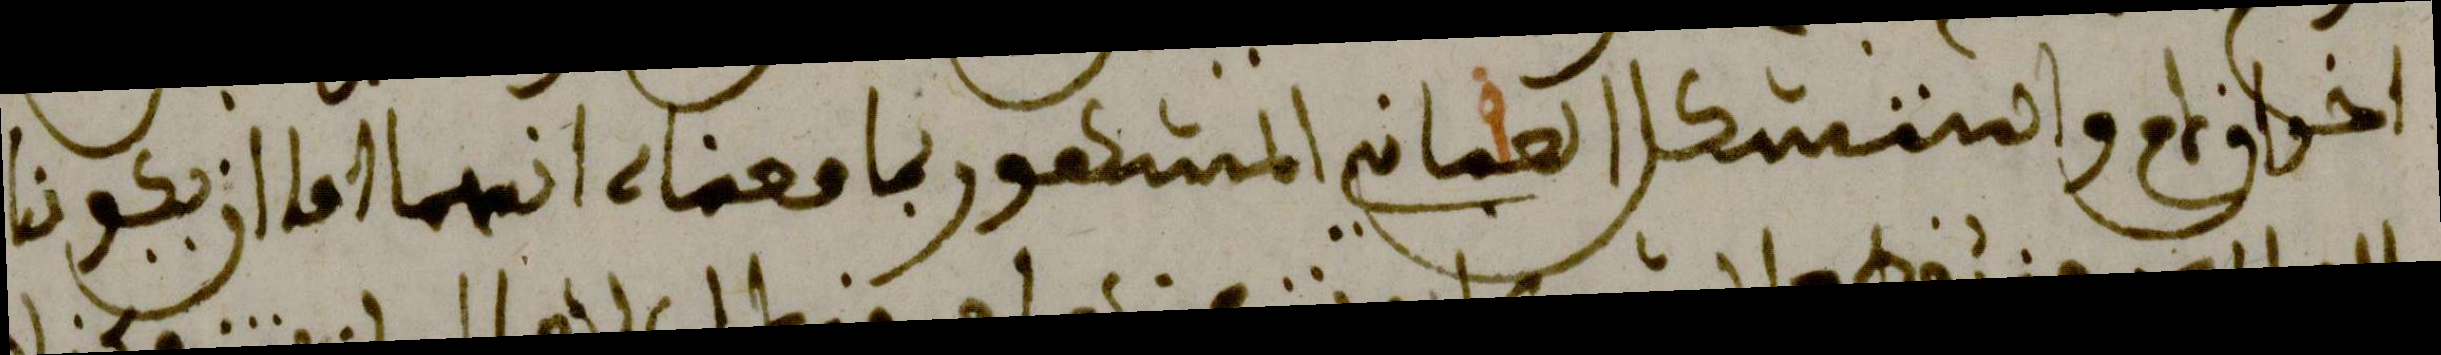اخوان لام و استشكل العباني المشهور بما معناه انهما اما ان يكونا
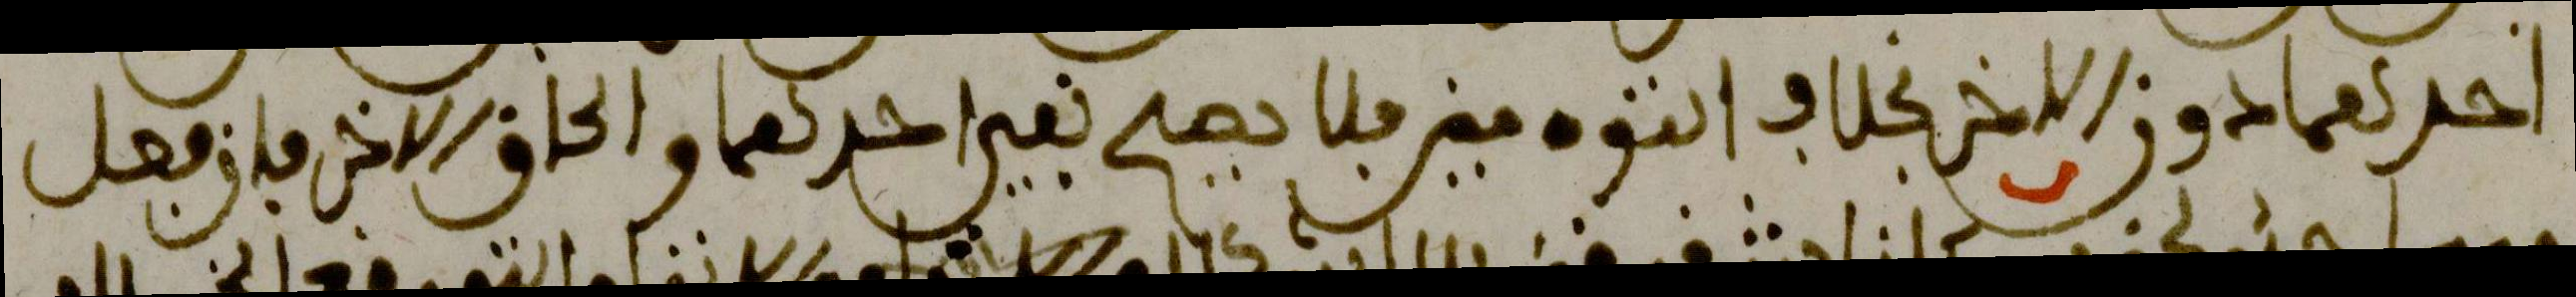احدهما دون الاخر بخلاف التوءمين فلا يصح نفي احدهما و الحاق الاخر فان فعل
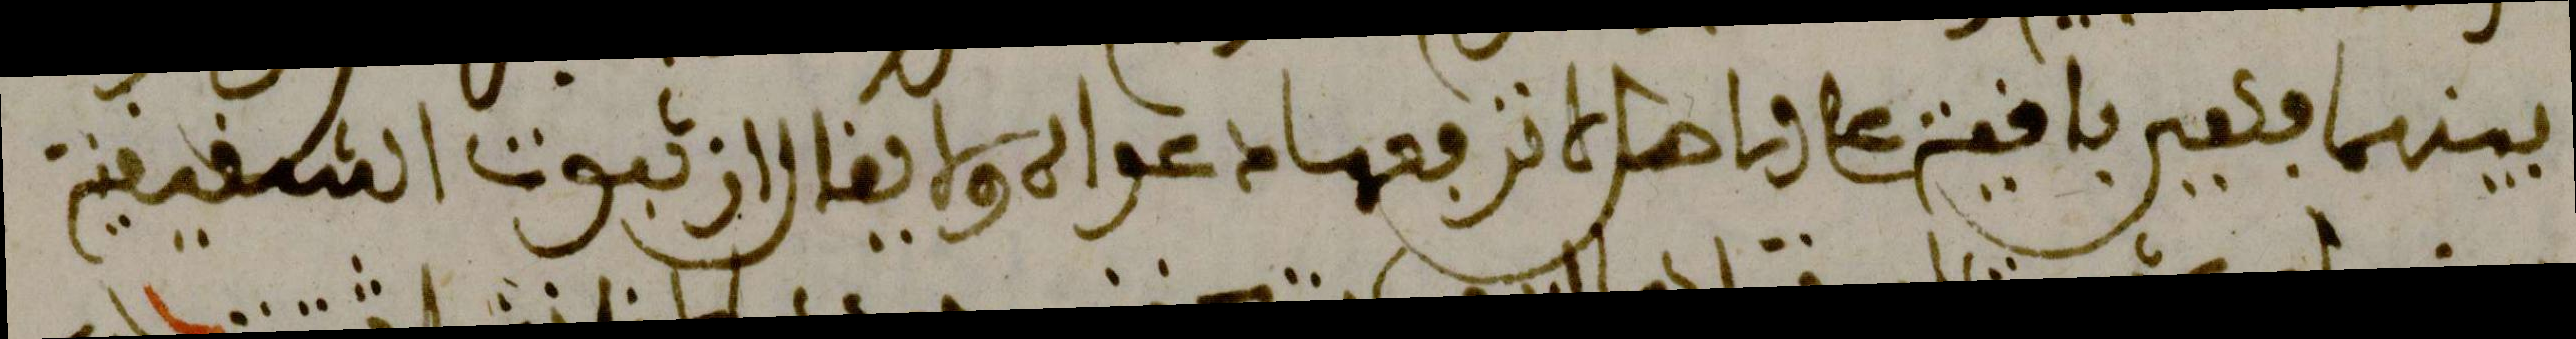بينهما فهي باقية على الاصل لا ترفعها دعواه و لا يقال ان ثبوت الشقيقية
